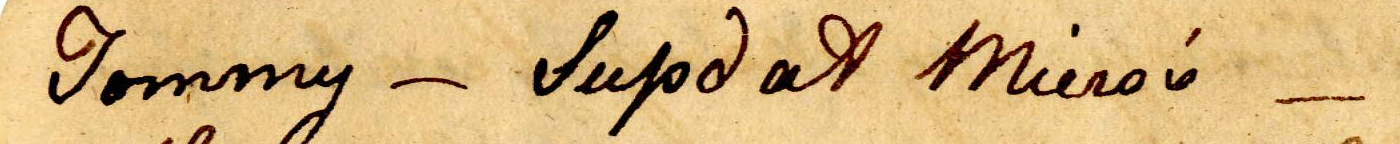Tommy- Supd at Miers's-
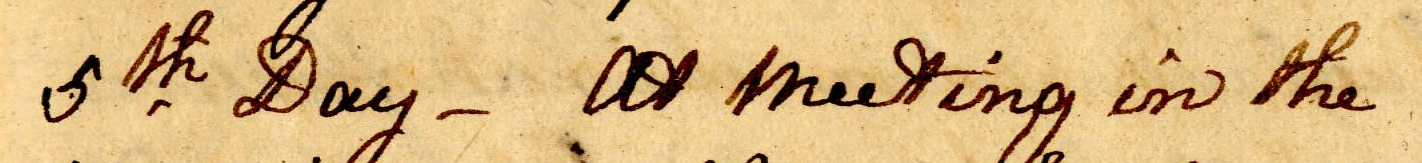5^th Day- At Meeting in the
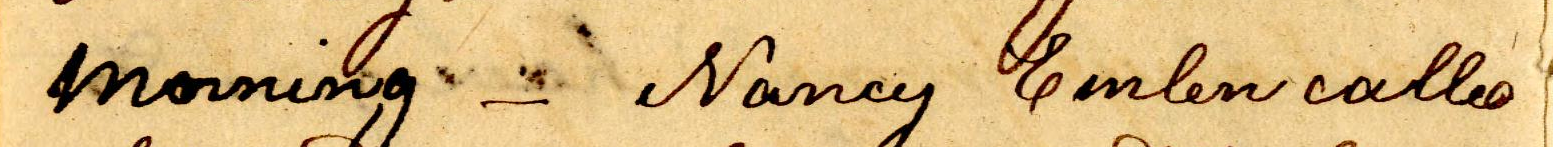Morning - Nancy Emlen called
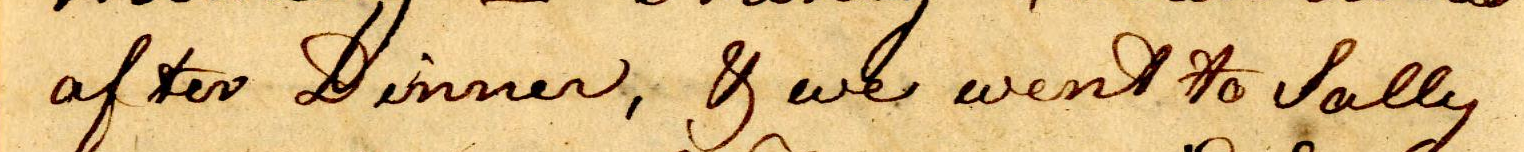after Dinner, & we went to Sally
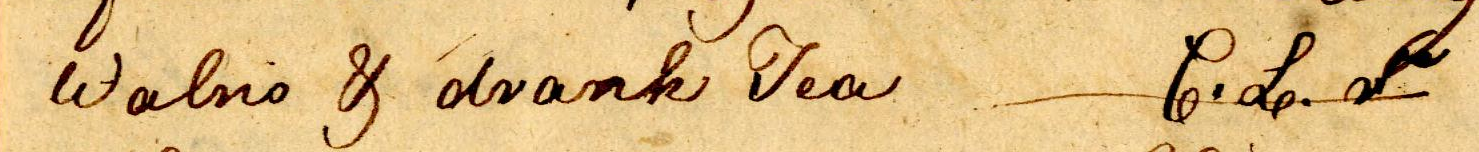Walns & drank Tea- C. L. d
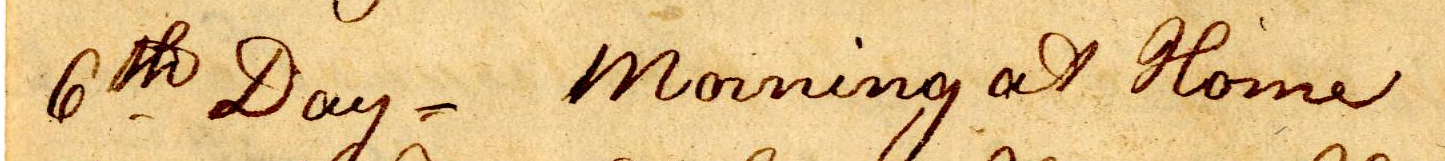6^th Day- Morning at Home
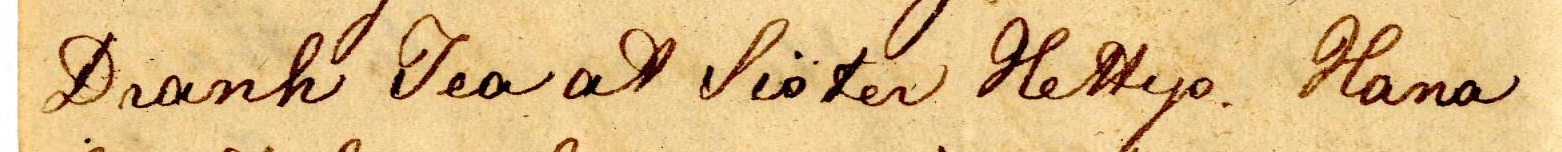Drank Tea at Sister Hettys. Hana
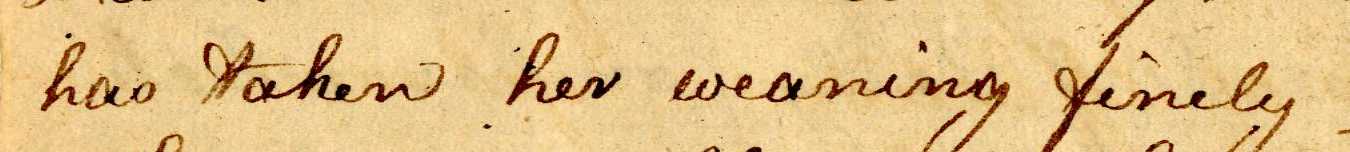has taken her weaning finely
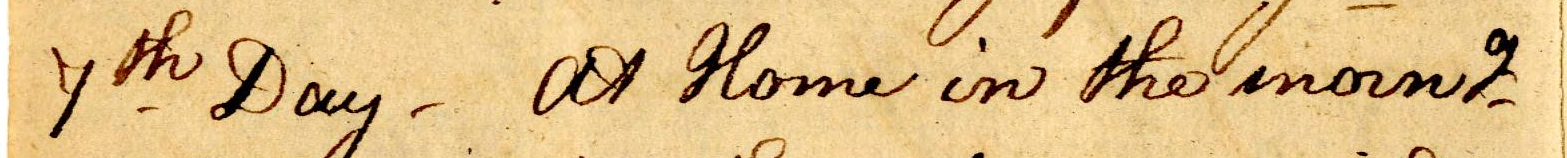7^th Day- At Home in the morn^g
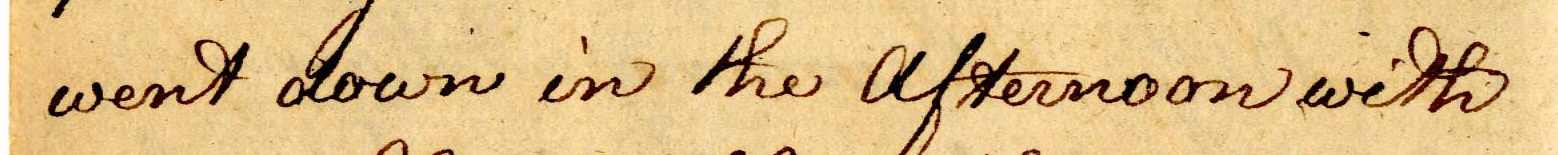went down in the Afternoon with
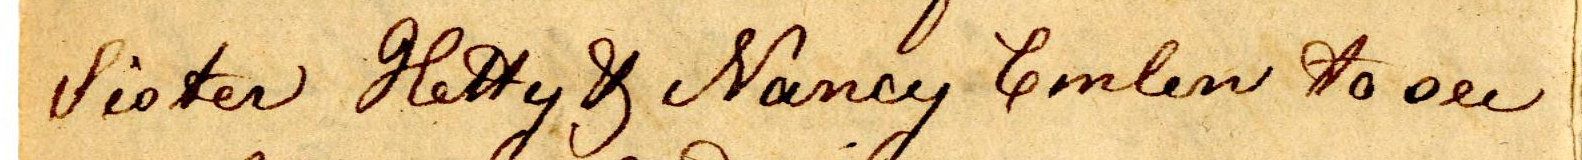Sister Hetty & Nancy Emlen to see
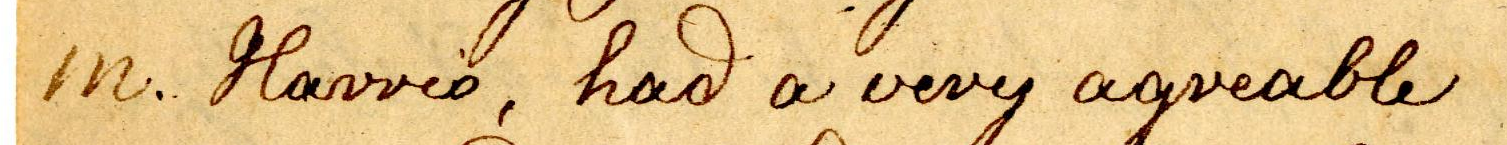M. Harris, had a very agreable
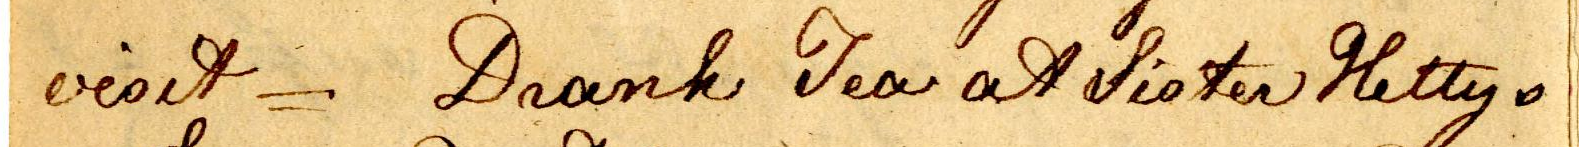visit- Drank Tea at Sister Hettys
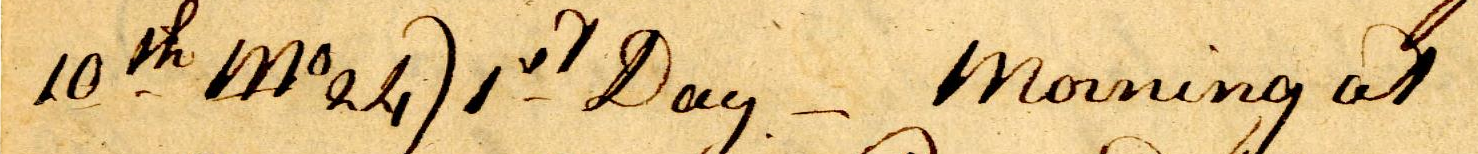10^th M^o 24) 1^st Day- Morning at
